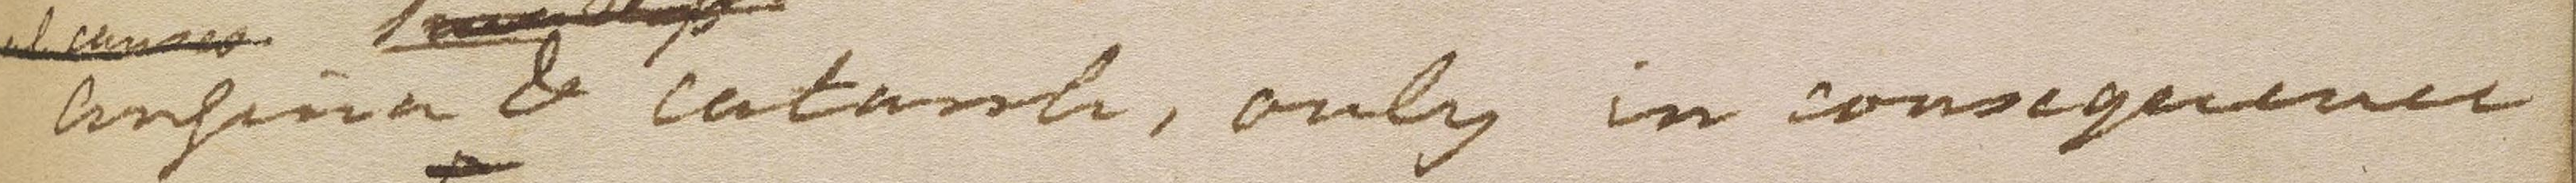Angina & Catarrh, only in consequence
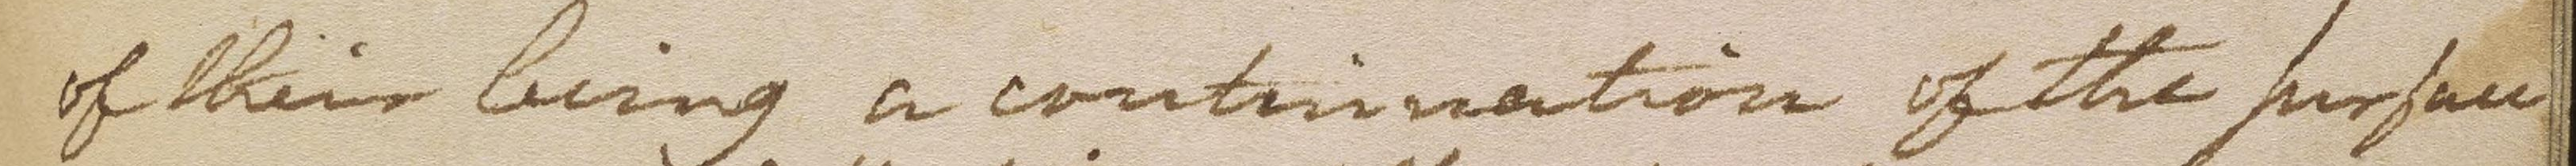of their being a continuation of the surface
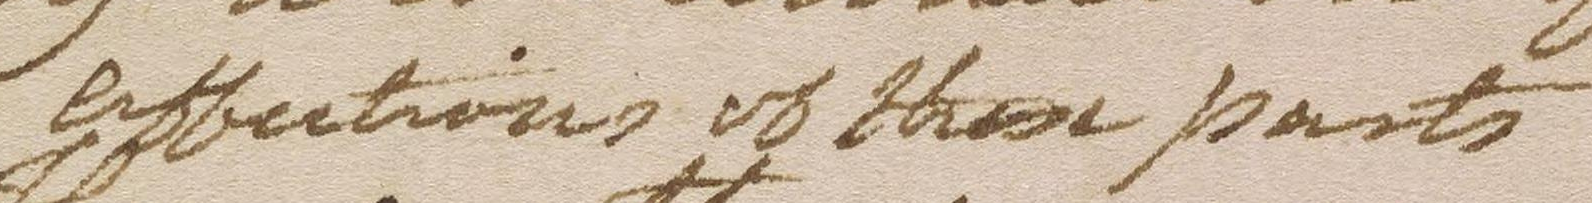Affections of these parts
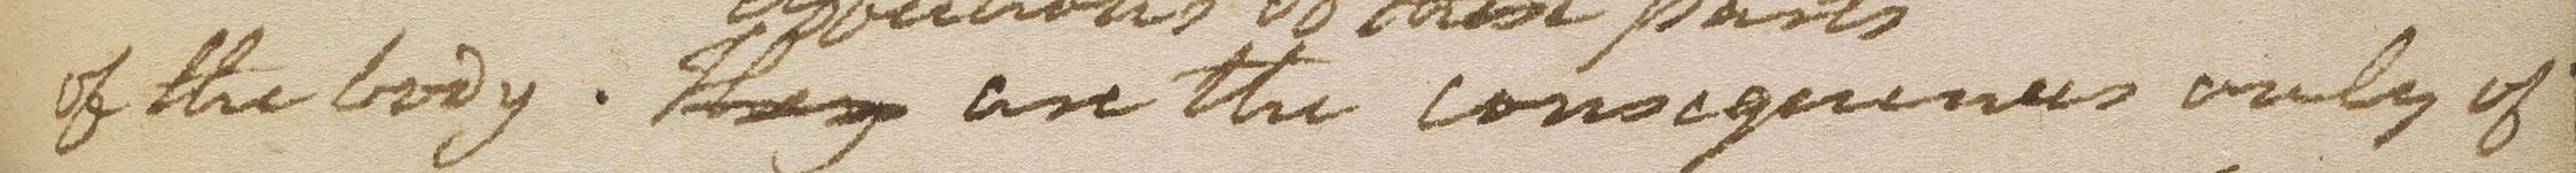of the body. [They] are the consequences only of
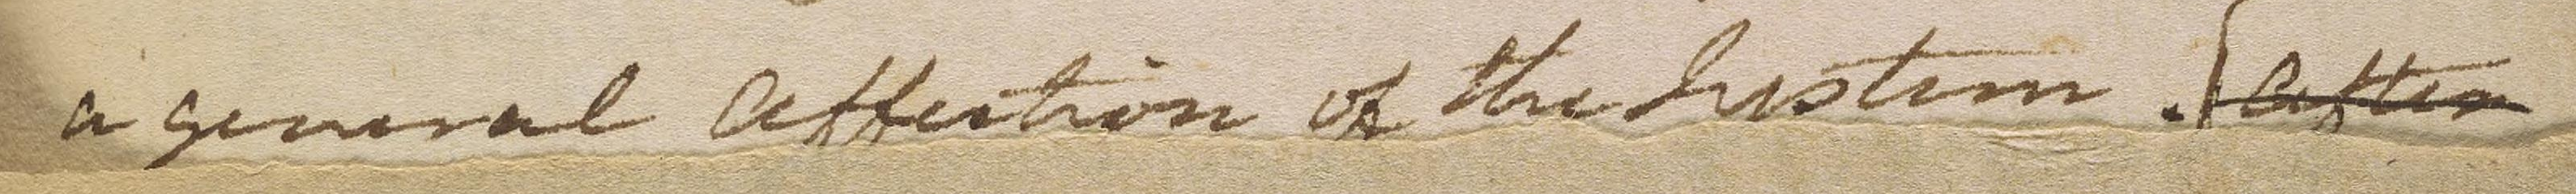a general Affection of the system. ([after]
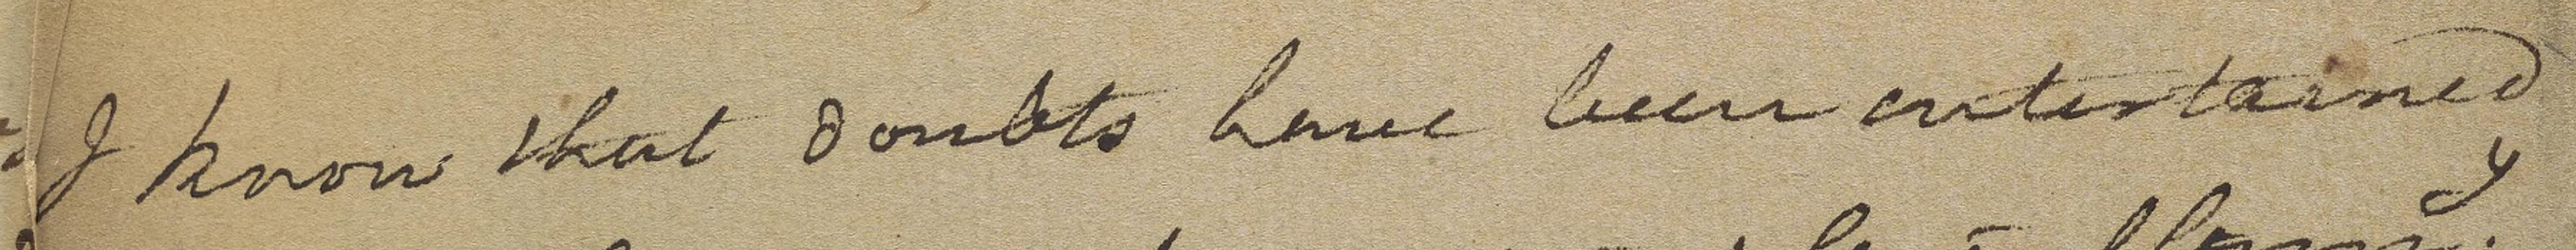I know that doubts have been entertained
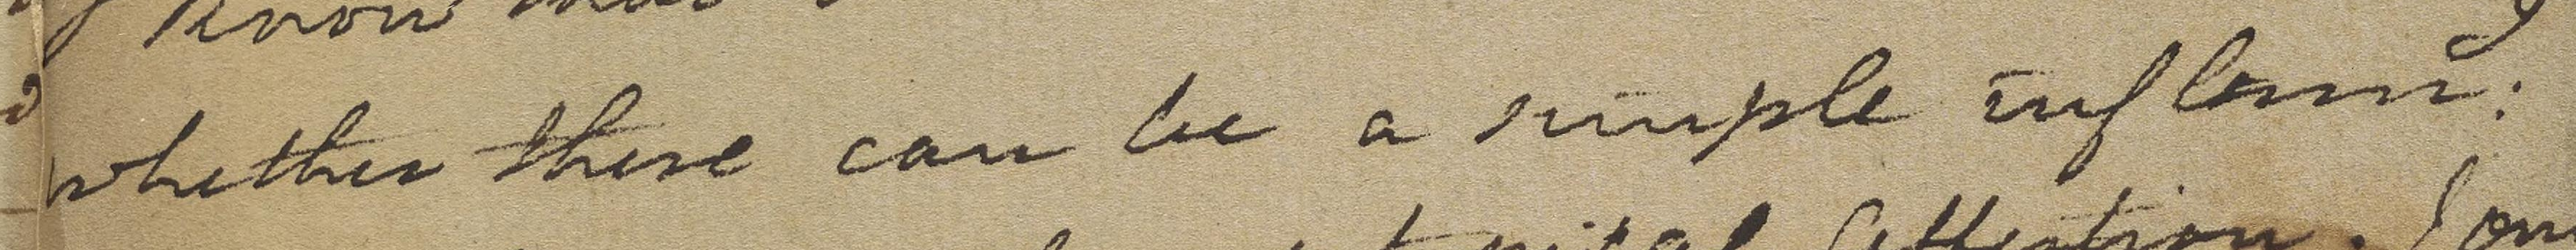whether these can be a simple inflam^y
